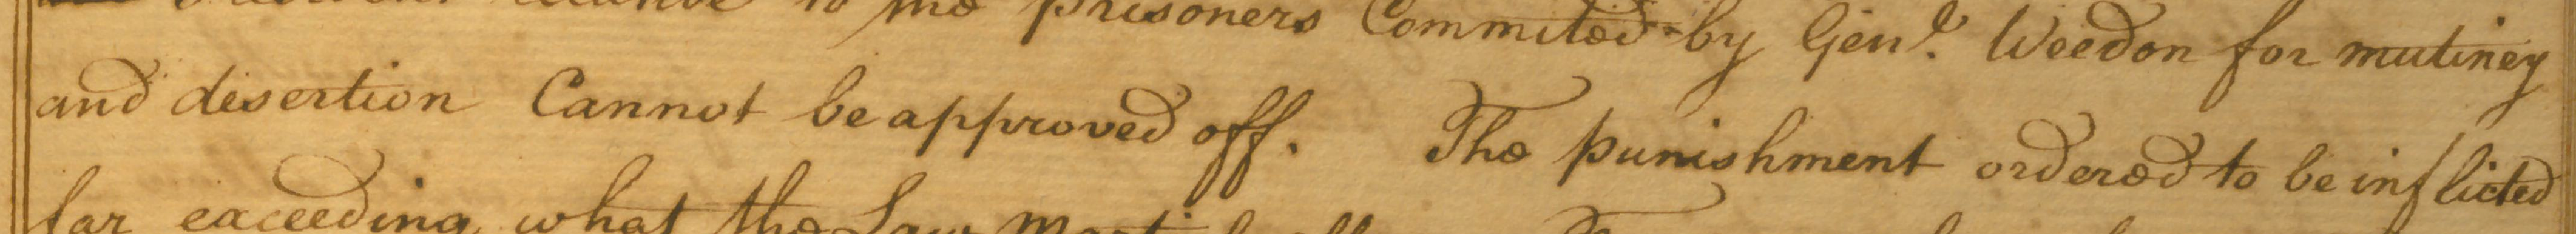and desertion Cannot be approved off. The punishment ordered to be inflicted
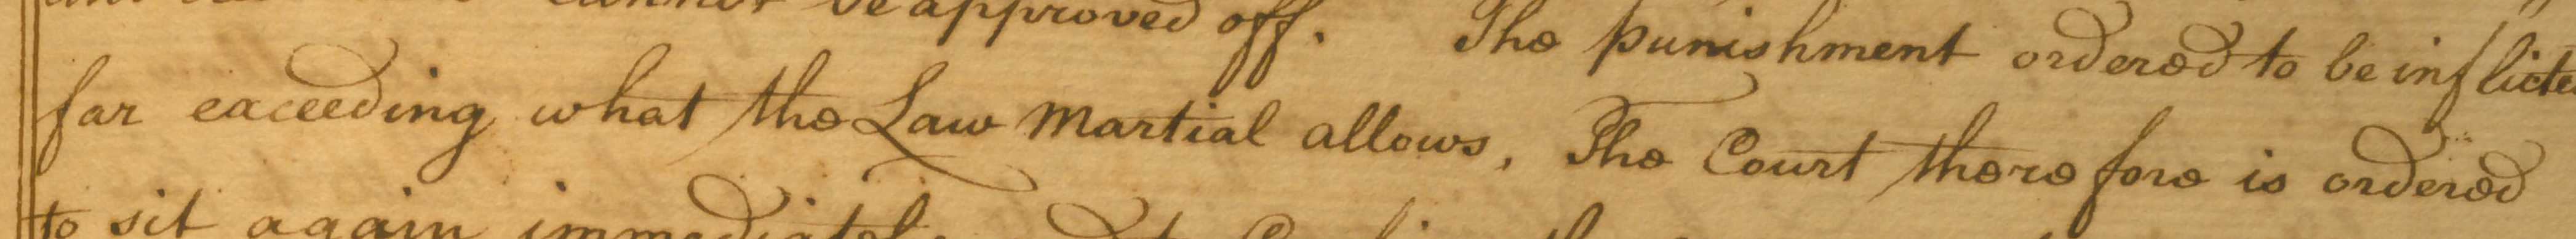far exceeding what the Law martial allows. The Court therefore is ordered
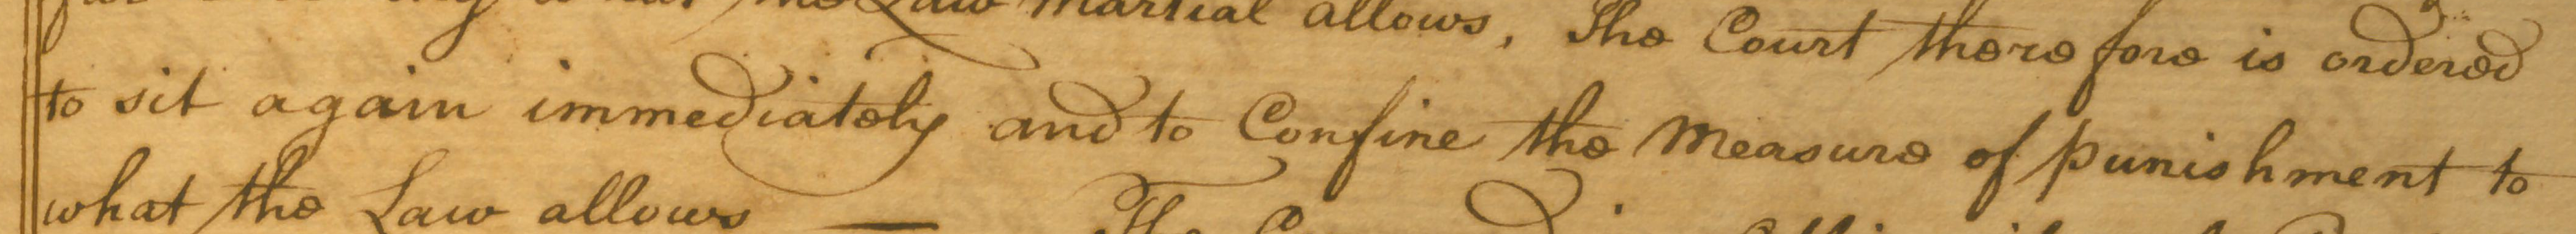to sit again immediately and to Confine the measures of punishment to
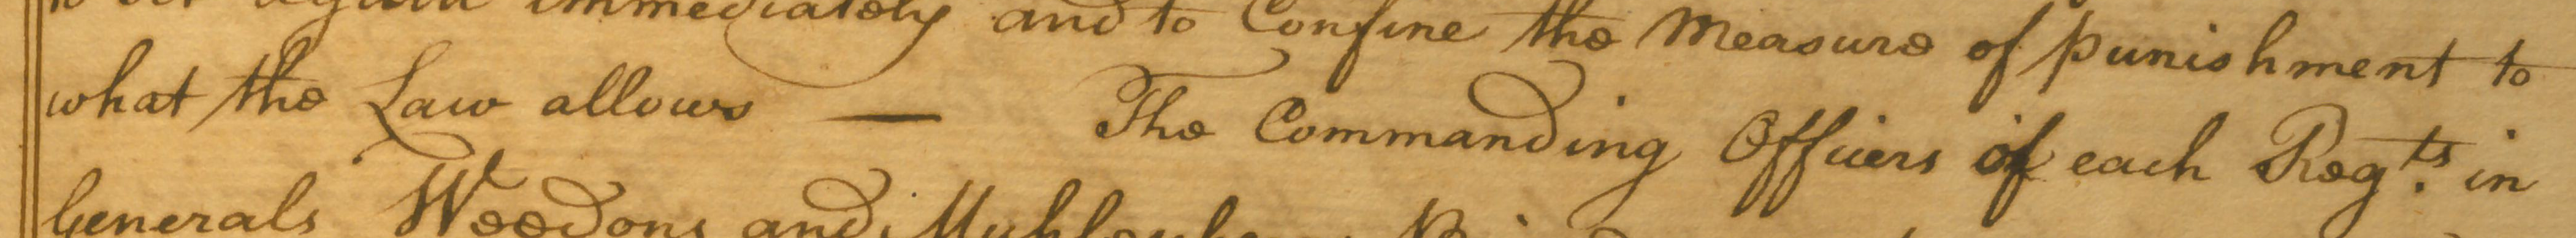what the Law allows- The Commanding Officers of each Reg^ts. in
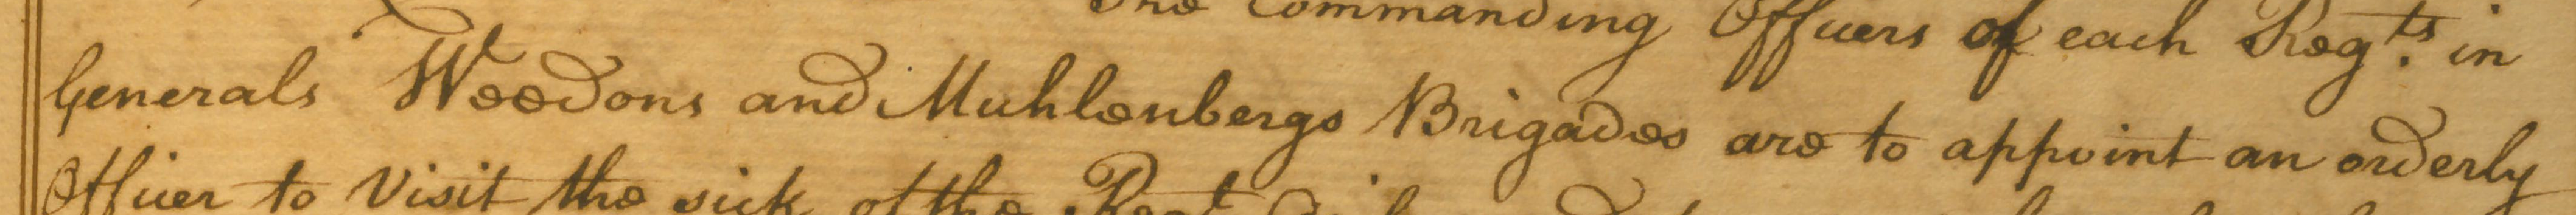General Weedons and Muhlenbergs Brigades are to appoint an orderly
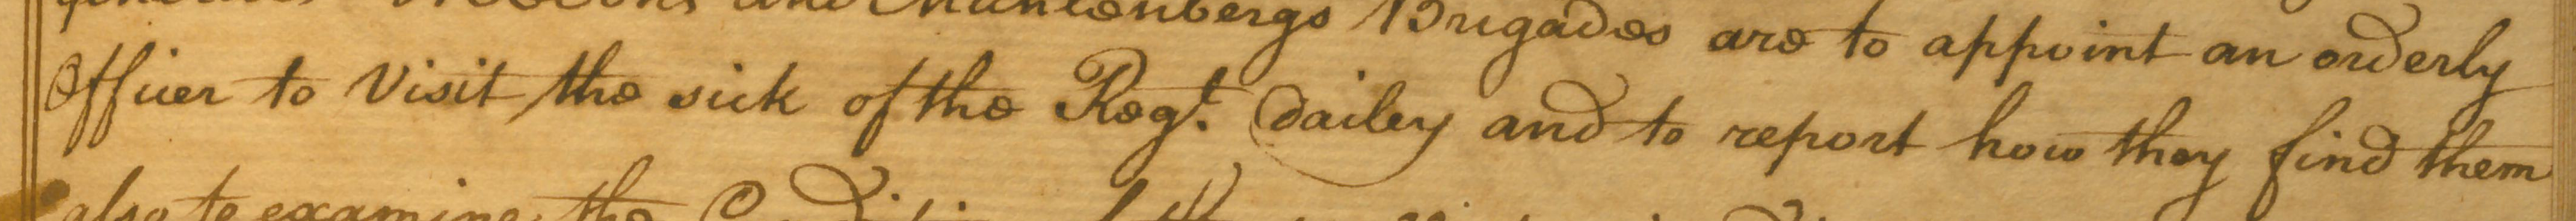Officer to visit the sick of the Reg^t. daily and to report how they find them
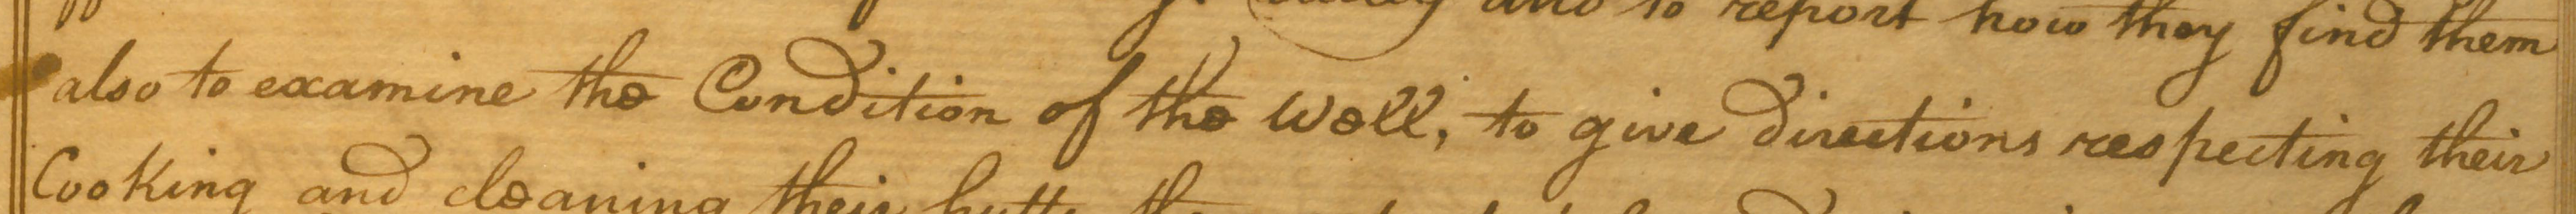also to examine the Condition of the well, to give directions respecting their
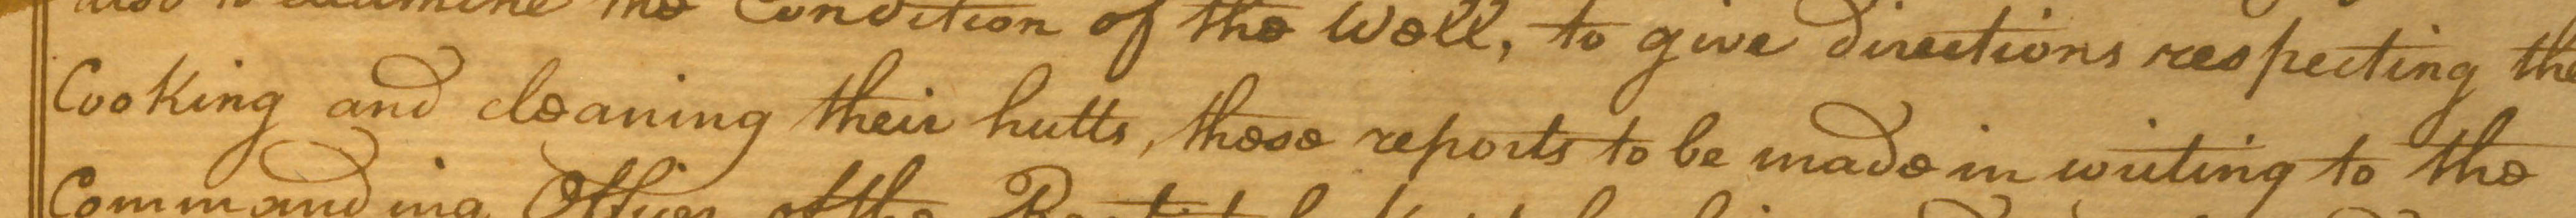Cooking and cleaning their hutts, these reports to be made in writing to the
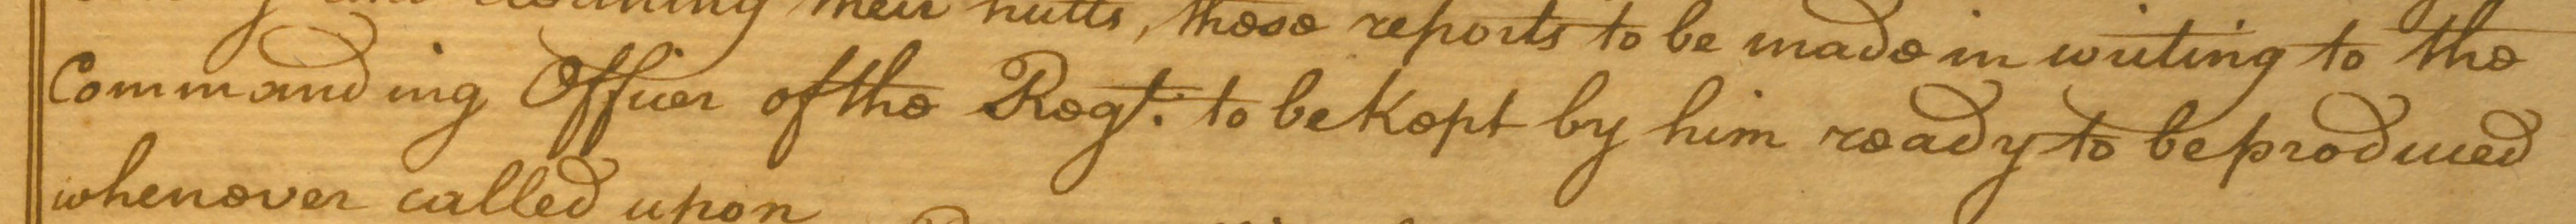Commanding Officer of the Reg^t. to be kept by him ready to be produced
